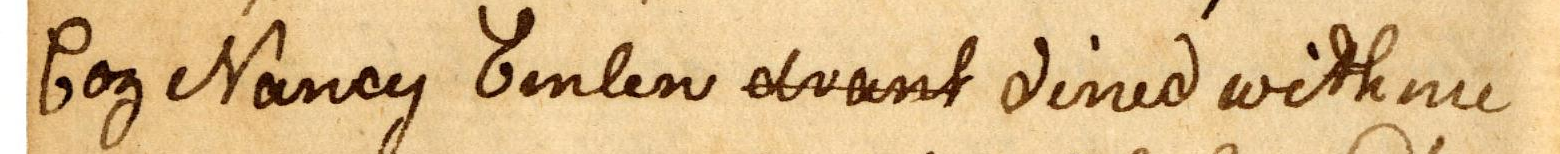Coz Nancy Emlen drank dined with me
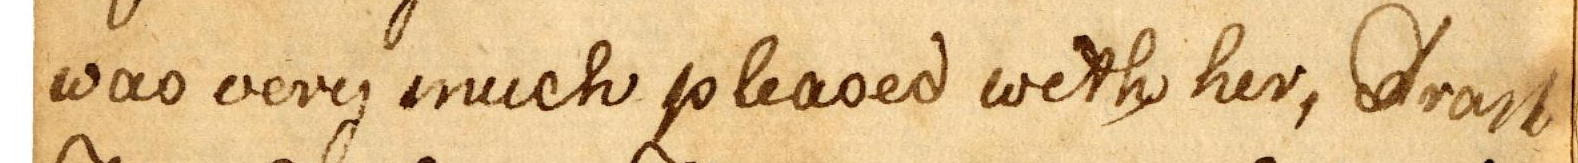was very much pleased with her, drank
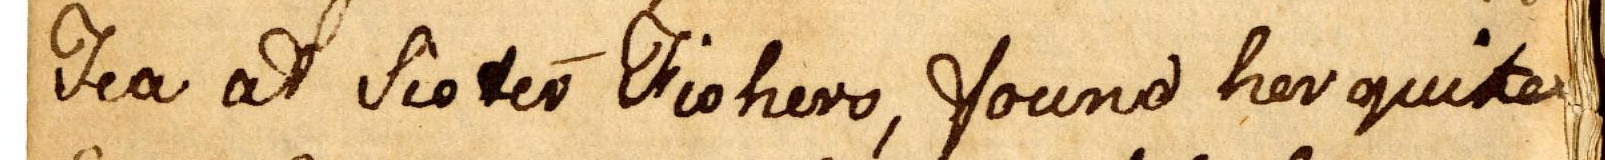Tea at Sister Fishers, found her quiter
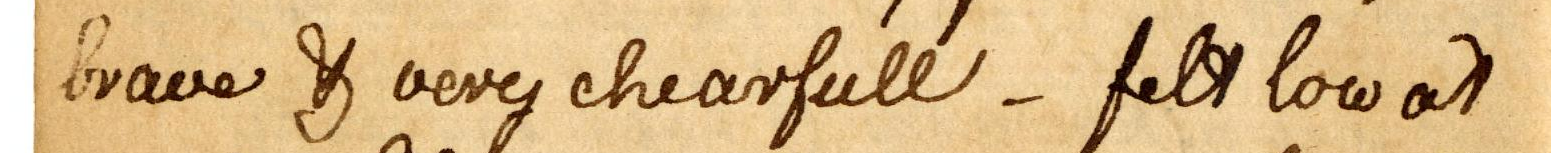brave & very chearfull- felt low at
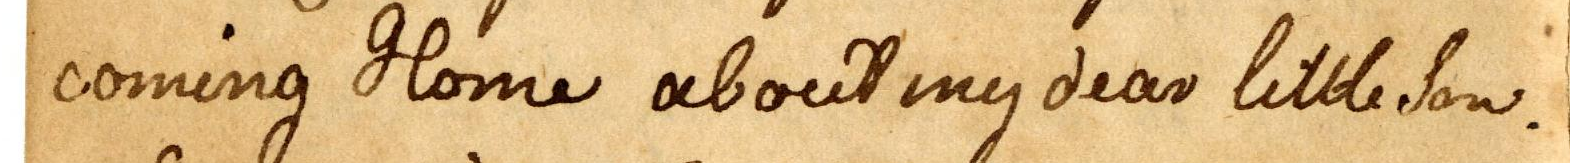coming Home about my dear little Son.
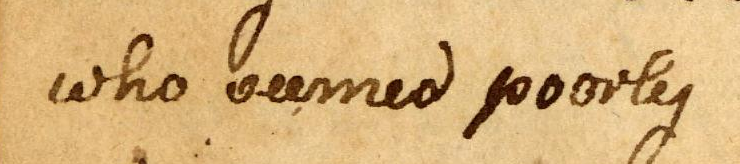who seemed poorly
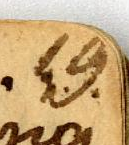19
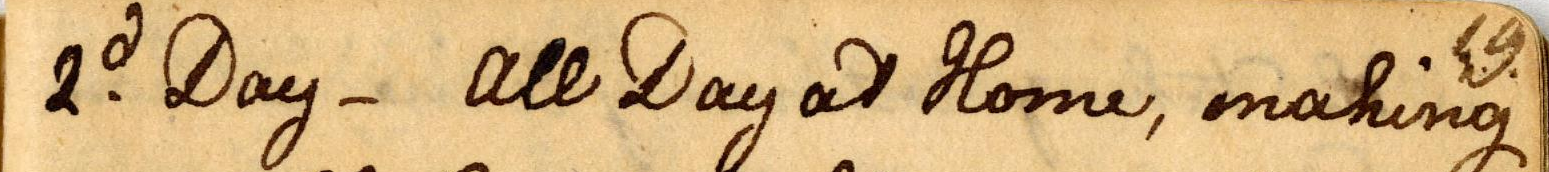2^d. Day- All Day at Home, making
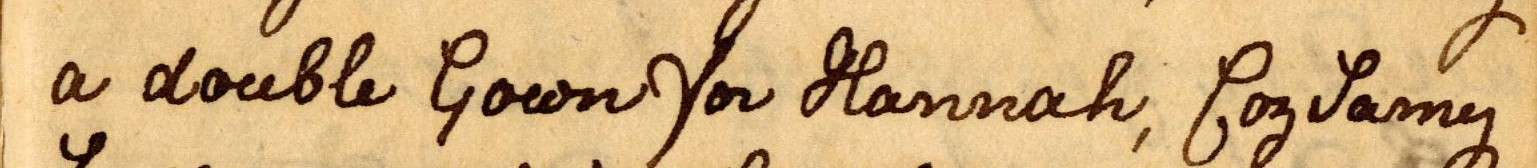a double Gown for Hannah, Coz Samy
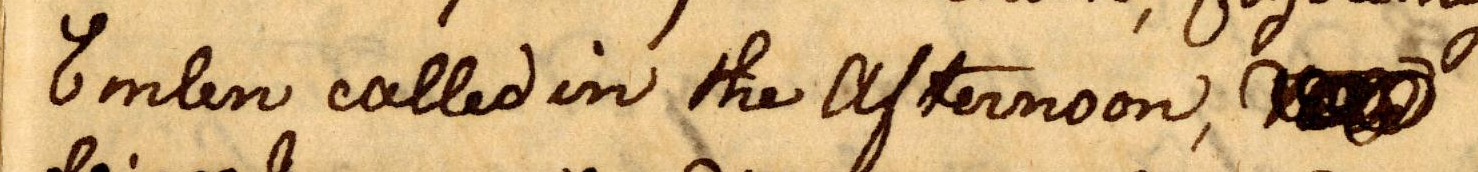Emlen called in the Afternoon, [___]
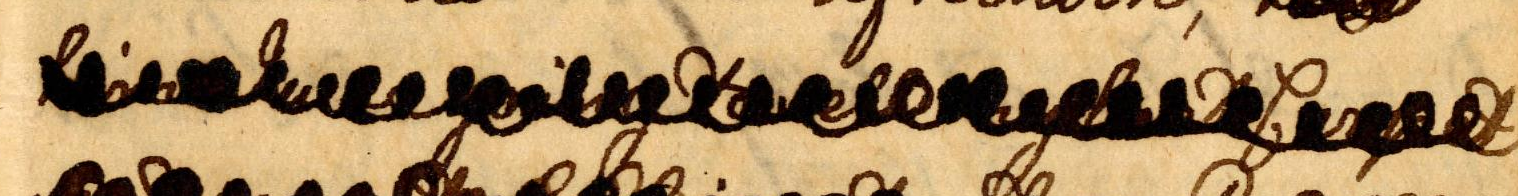[_________________________]
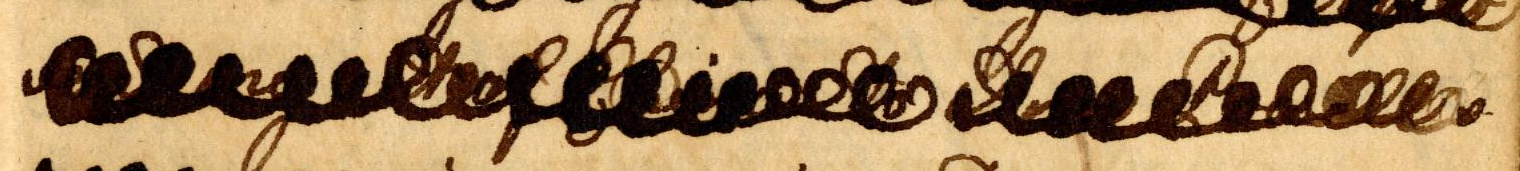[_______________________]
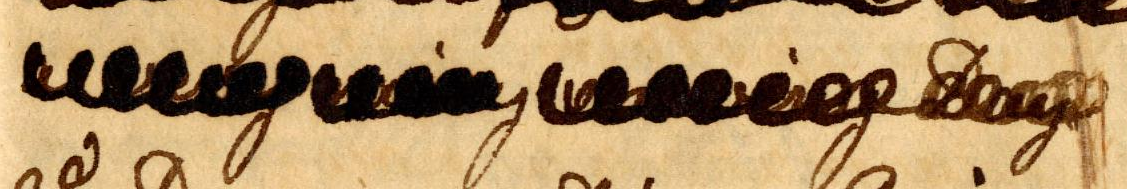[_________________]
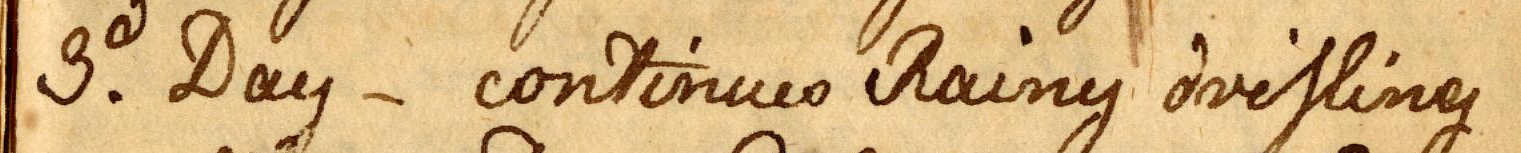3^d. Day- continues Rainy drisling
